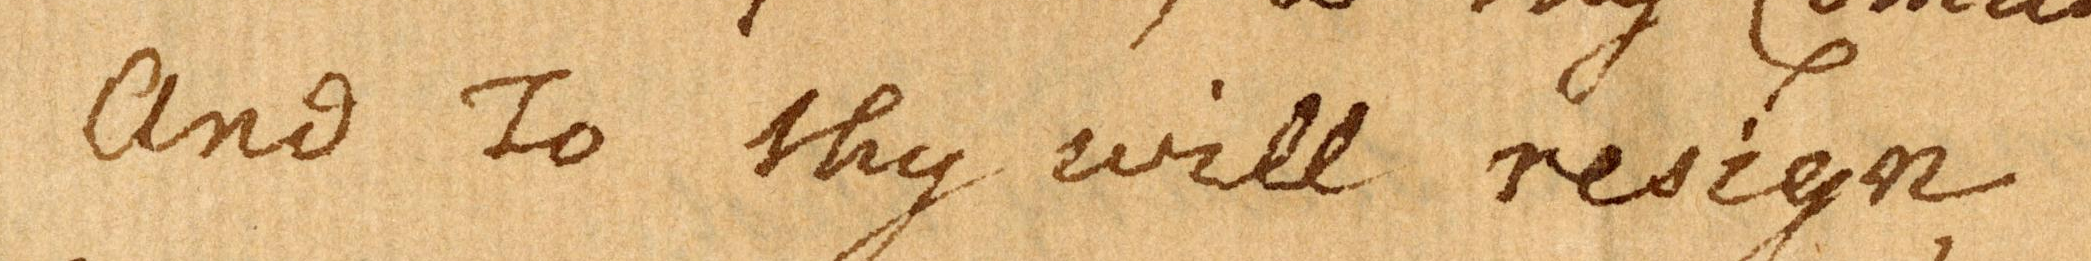And To thy will resign,
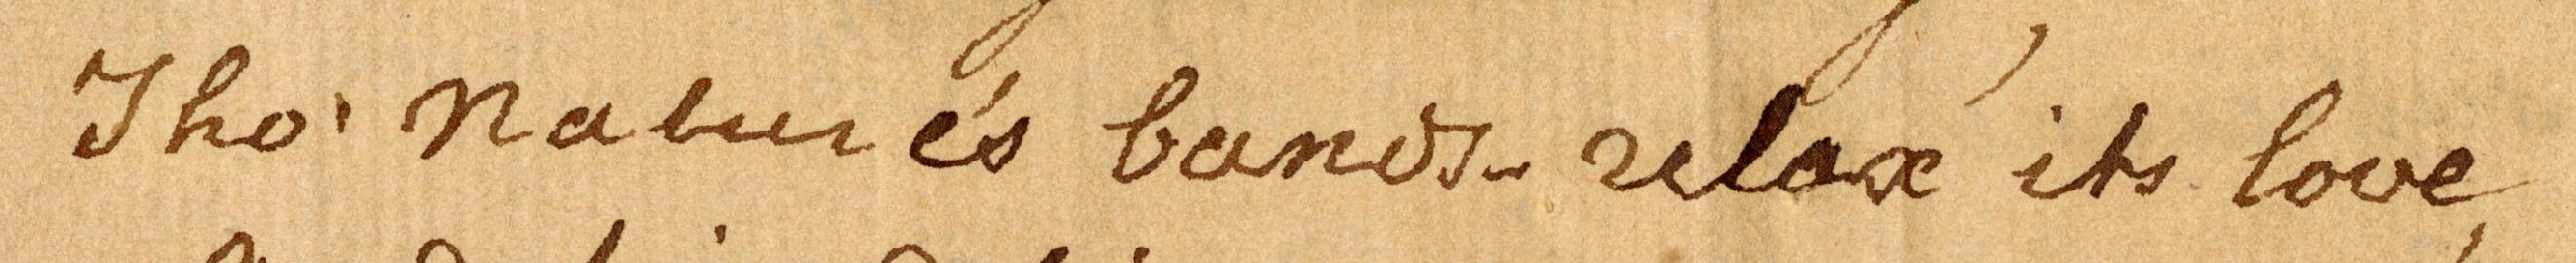Tho' Nature's bands- relax its love,
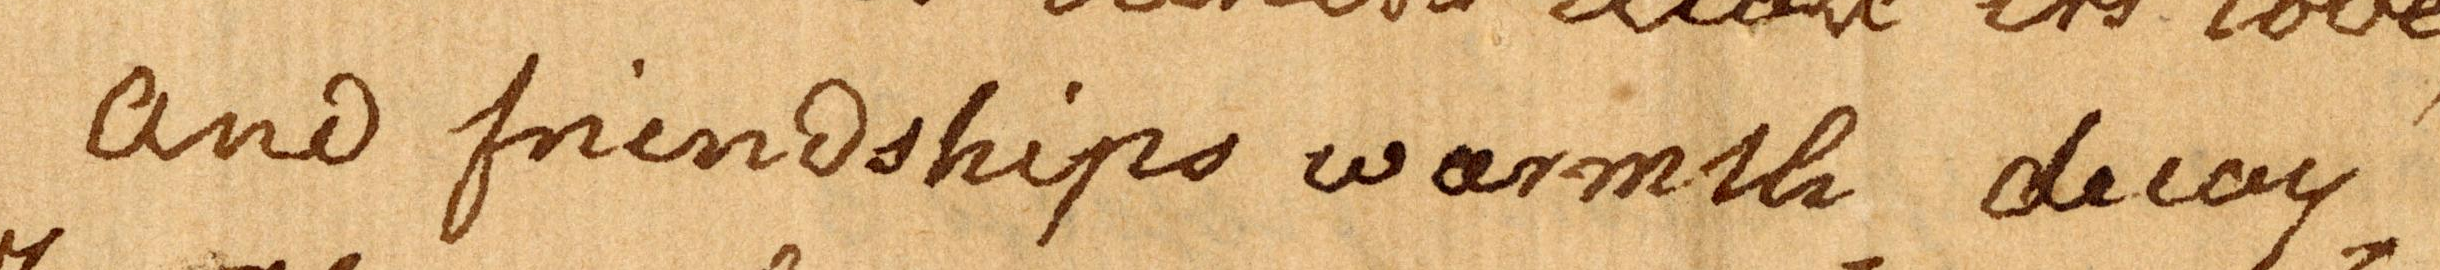And friendships warmth decay,
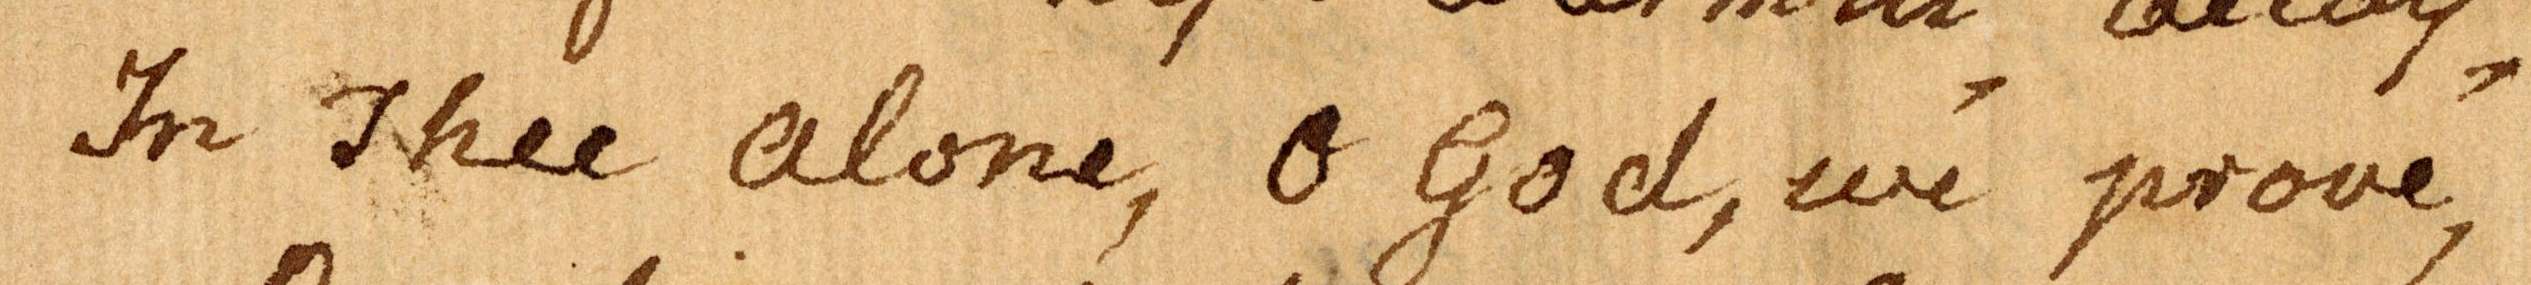In Thee alone, O God, we prove,
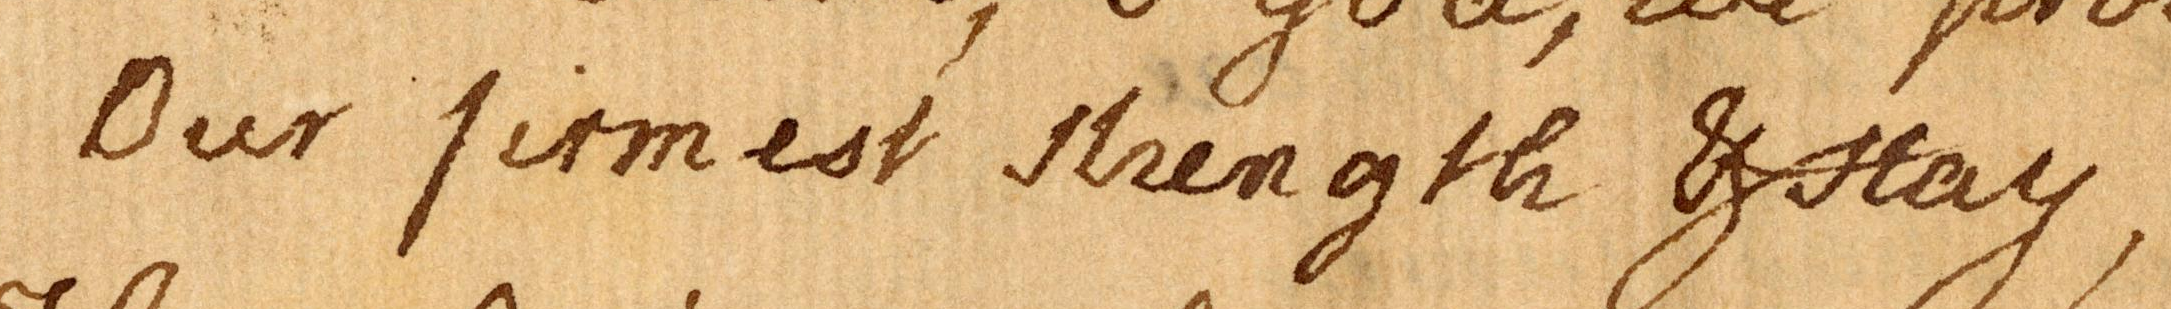Our firmest strength & stay,
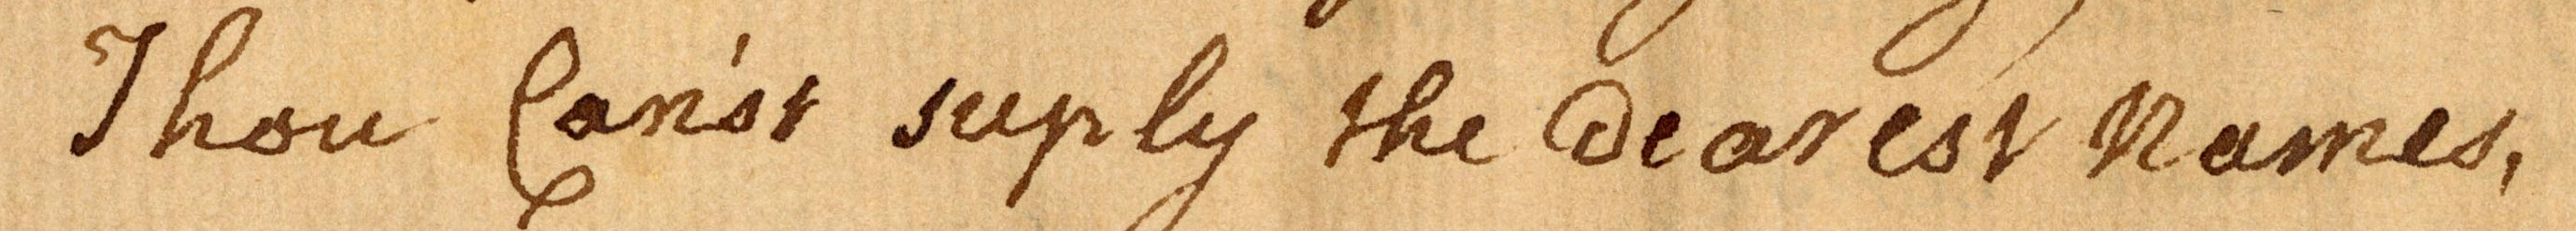Thou Can'st suply the Dearest Names,
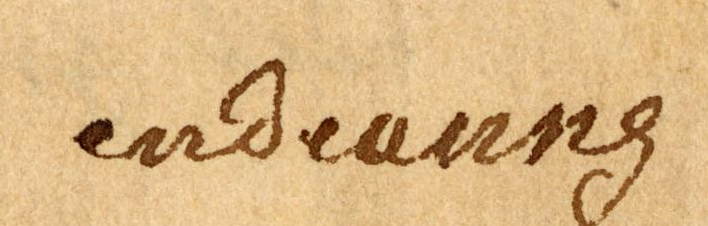endearing
